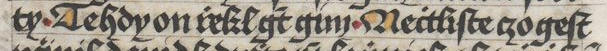ty.Tehdy on ṙekl ḡt gim.Neċtli ſte czo geſt
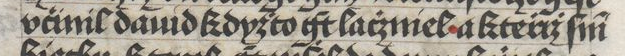vċinil dauid kdyżto ḡt laċzníel.a kteṙiż ſnī
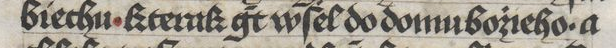bíechu.kterak ḡt wẛel do domu bożieho.a
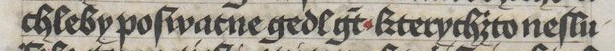chleby poſwatne gedl ḡt.kterychżto neſlu¬
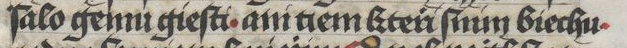ẛalo gemu gíeſti.ani tiem kteṙí ſním bíechu.
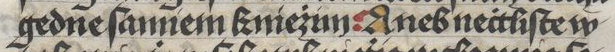gedne ſamiem knieżim?A neb neċtliſte w
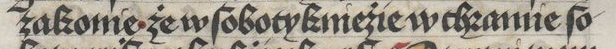zakonie.że w ſoboty knieżíe w chramie ſo¬
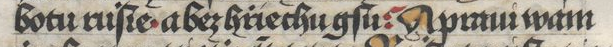botu ruẛie.abez hṙíechu gſu?A praui wam
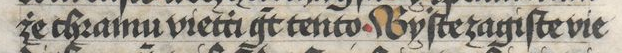że chramu vietċi ḡt tento.Byẛte zagiſte vie¬
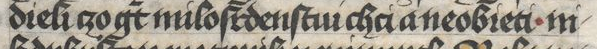dieli czo ḡt miloſrdenſtuí chci a neobieti.ni¬
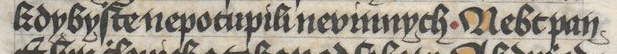kdybyẛte nepotupili nevinnych.Nebt pan
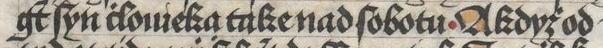ḡt ſyn ċlouieka take nad ſobotu.Akdyż od
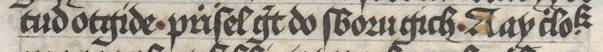tud otgíde.pṙiẛel ḡt do ſboru gich.Aay ċlok¬
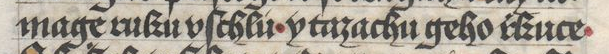mage ruku uſchlú.y tazachu geho ṙkuce.
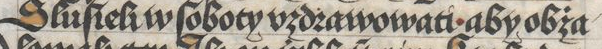Sluẛieli w ſoboty vzdrawowati.aby obża¬
